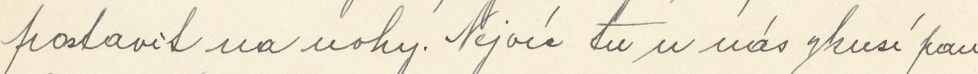postavit na nohy. Nejvíc tu u nás zkusí pan
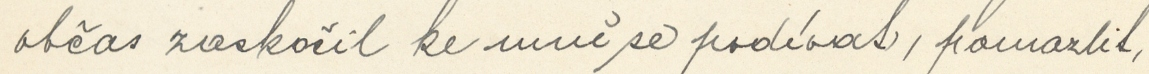občas zaskočil ke mně se podívat, pomazlit,
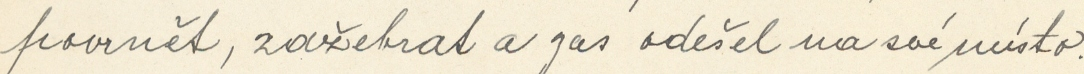povrnět, zažebrat a zas odešel na své místo.
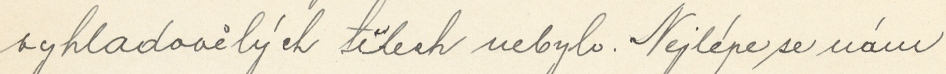vyhladovělých tělech nebylo. Nejlépe se nám
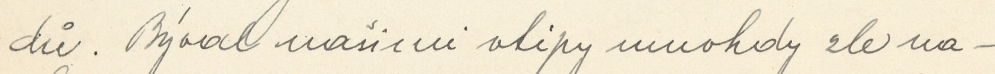dů. Býval našimi vtipy mnohdy zle na-
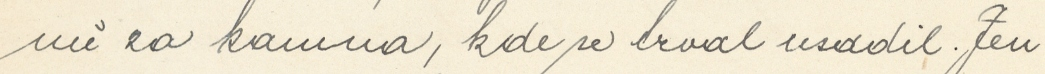mě za kamna, kde se trval usadil. Jen
